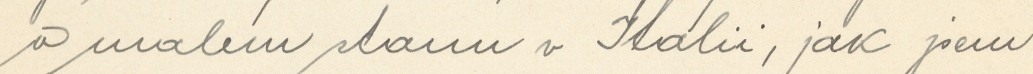v malém stanu v Italii, jak jsem
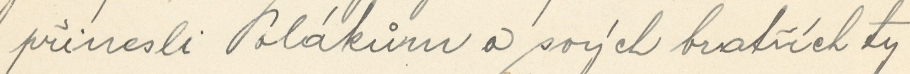přinesli Polákům o svých bratřích ty
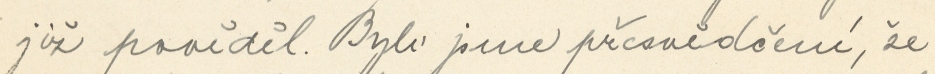již pověděl. Byli jsme přesvědčení, že
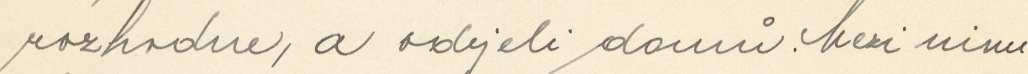rozhodne, a odejeli domů. Mezi nimi
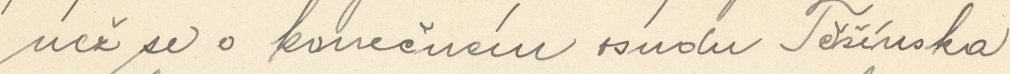než se o konečném osudu Těšínska
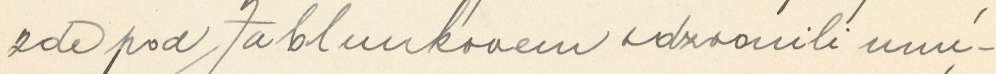zde pod Jablunkovem odzvonili umí-
